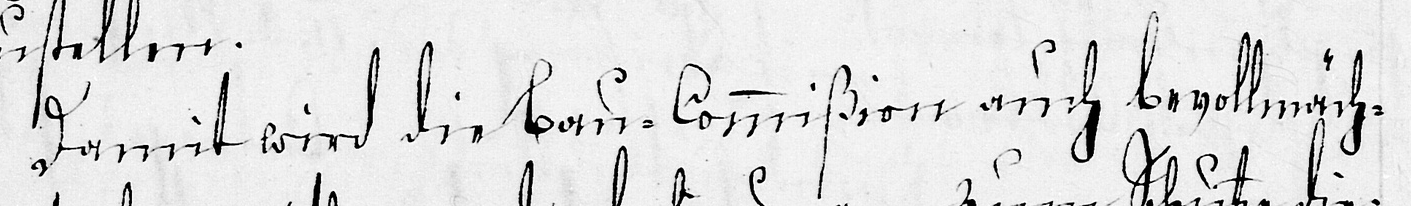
Damit wird die Bau-Commißion auch bevollmäch¬
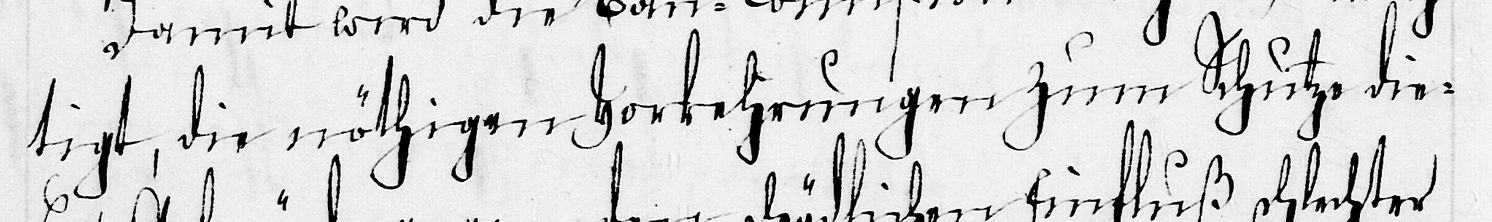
tigt, die nöthigen Vorkehrungen zum Schutze die¬
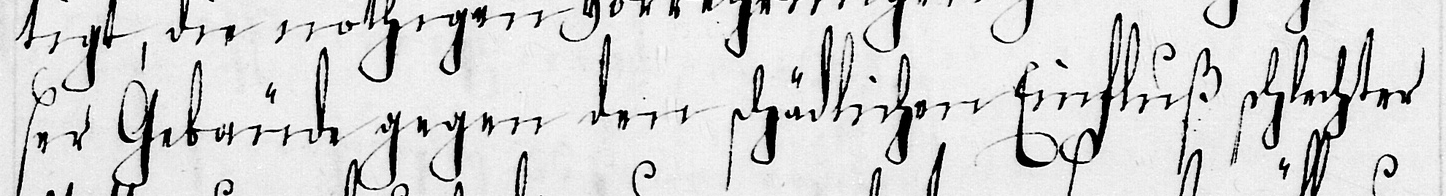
ser Gebäude gegen den schädlichen Einfluß schlechter
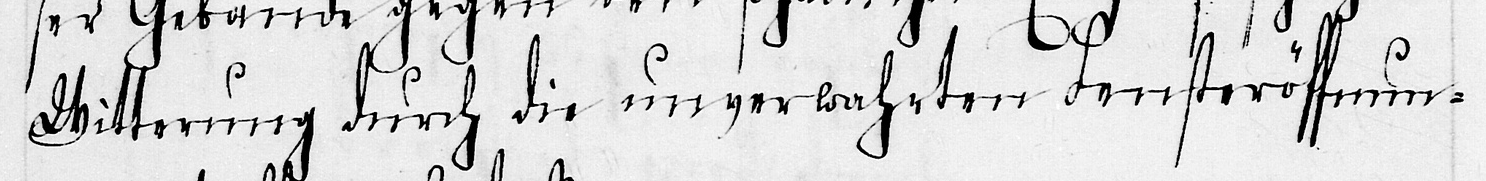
Witterung durch die unverwahrten Fensteröffnun¬
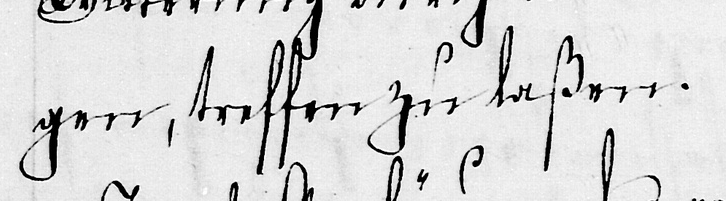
gen, treffen zu laßen.
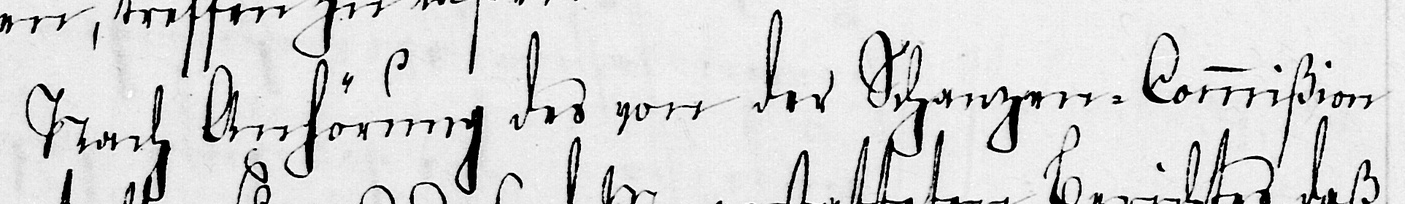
Nach Anhörung des von der Schanzen-Commißion
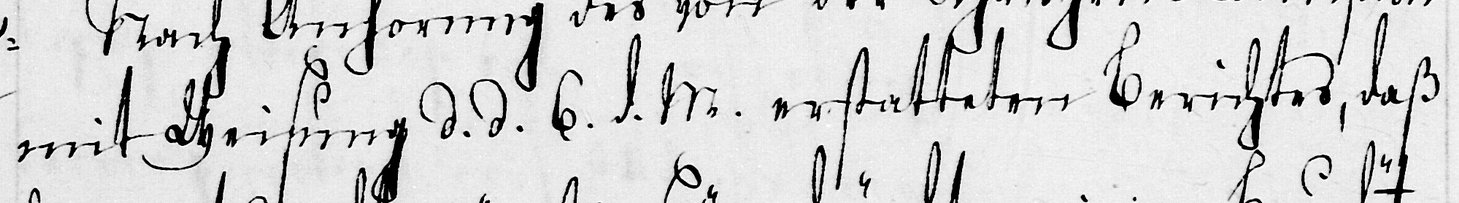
mit Weisung d. d. 6. d. M. erstatteten Berichtes, daß
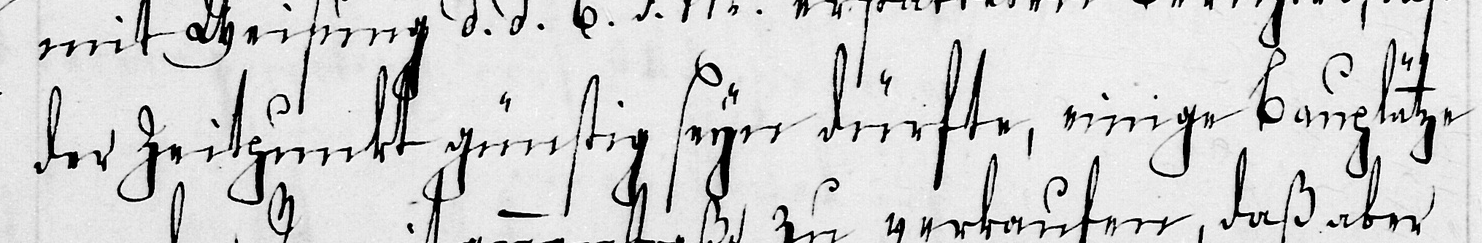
der Zeitpunkt günstig seyn dürfte, einige Bauplätze
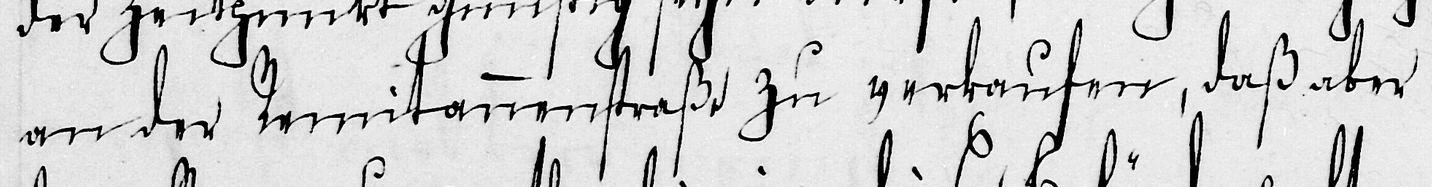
an der Remitannenstraße zu verkaufen, daß aber
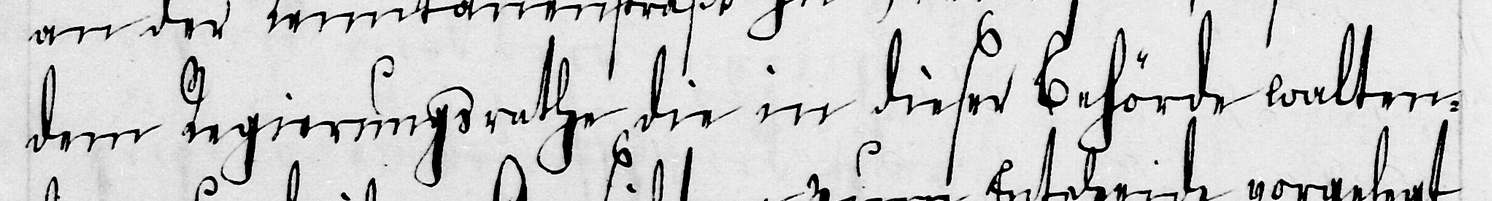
dem Regierungsrathe die in dieser Behörde walten¬
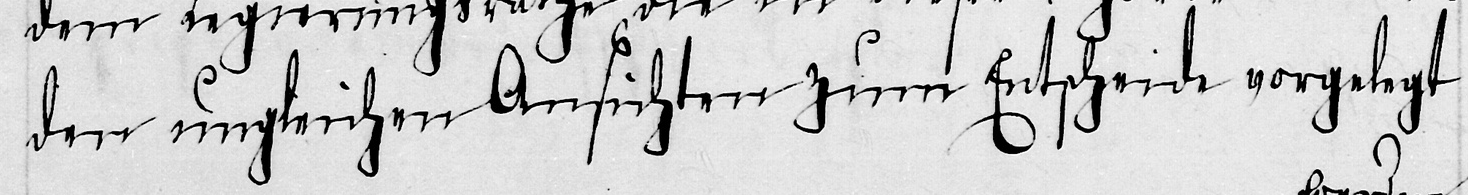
den ungleichen Ansichten zum Entscheide vorgelegt
